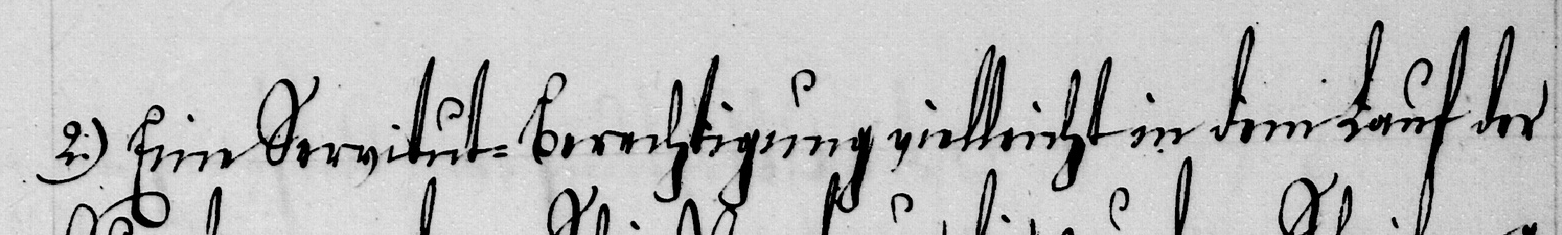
2.) Eine Servitut-Berechtigung vielleicht in dem Lauf der
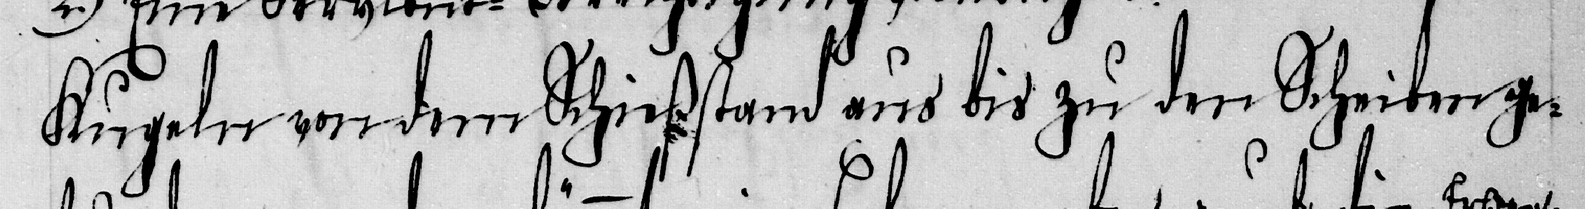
Kugeln von dem Schießstand aus bis zu den Scheiben ge¬
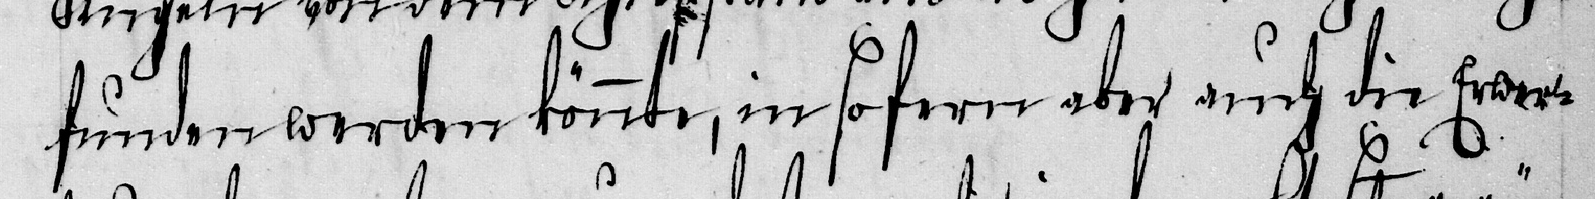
funden werden könnte, in sofern aber auch die Erwer¬
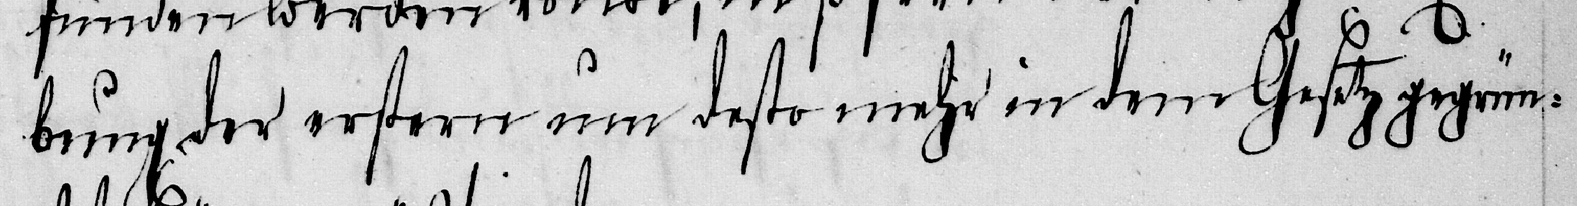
bung der ersten um desto mehr in dem Gesetz gegrün¬
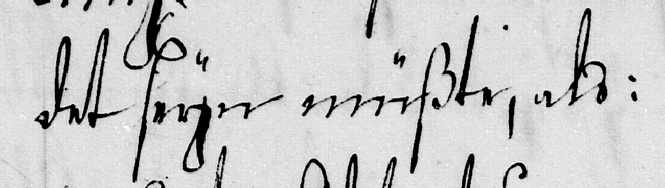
det seyn müßte, als:
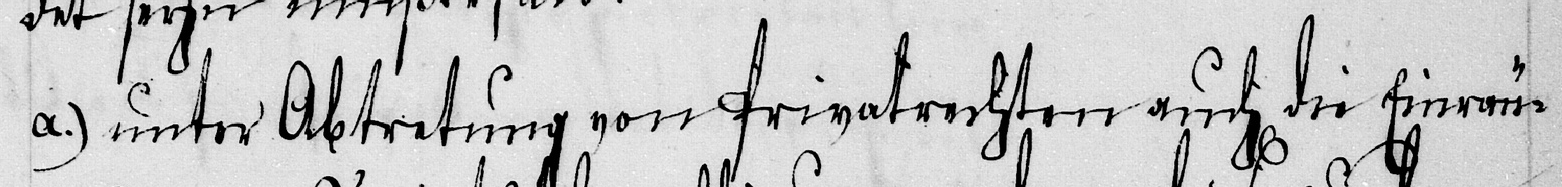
a.) unter Abtretung von Privatrechten auch die Einräu¬
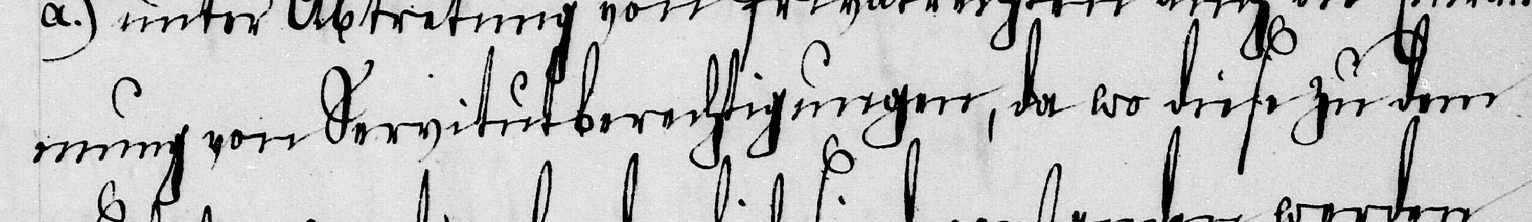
mung von Servitutberechtigungen, da wo diese zu dem
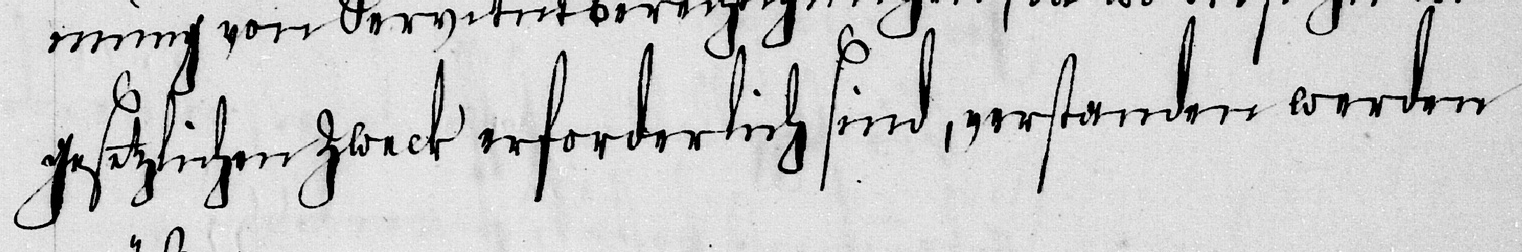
gesetzlichen Zweck erforderlich sind, verstanden werden
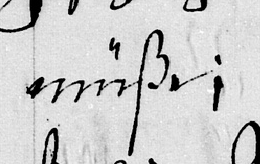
müße;
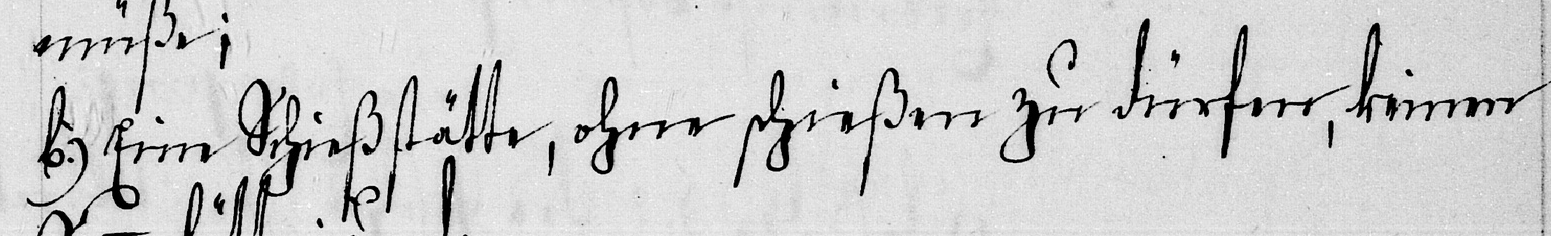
b.) Eine Schießstätte, ohne schießen zu dürfen, keinen
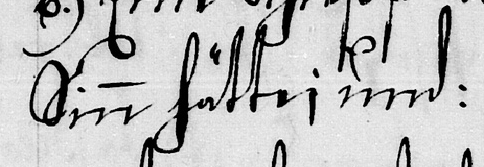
Sinn hätte; und:
